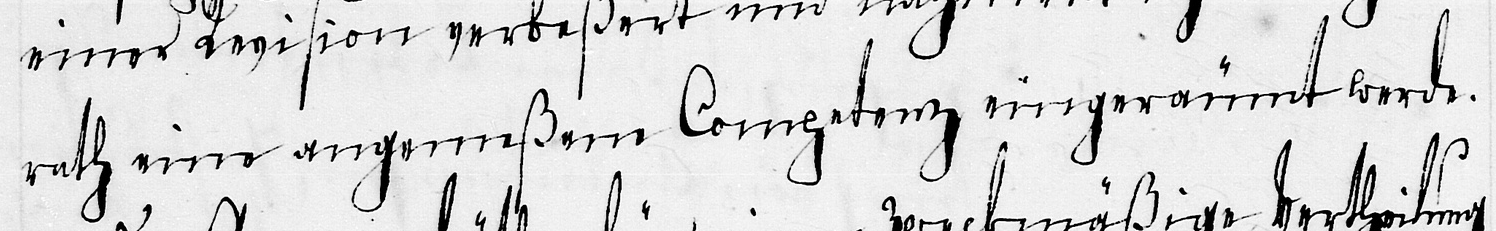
rath eine angmeßene Competenz eingeräumt werde.
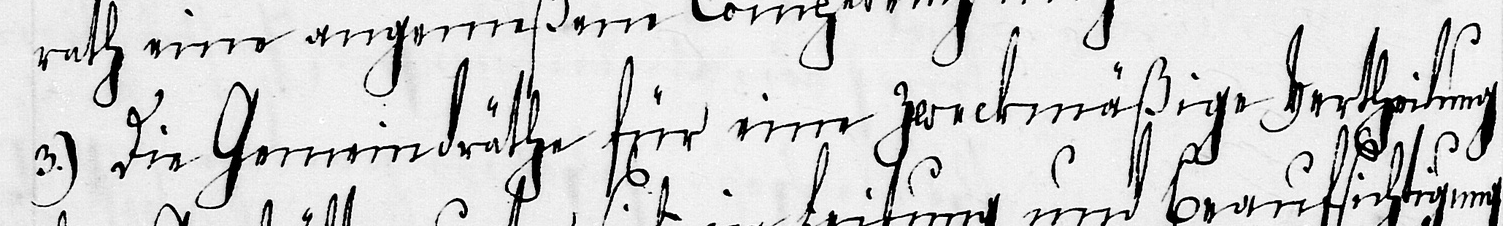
3.) Die Gemeindräthe für eine zweckmäßige Vertheilu¬
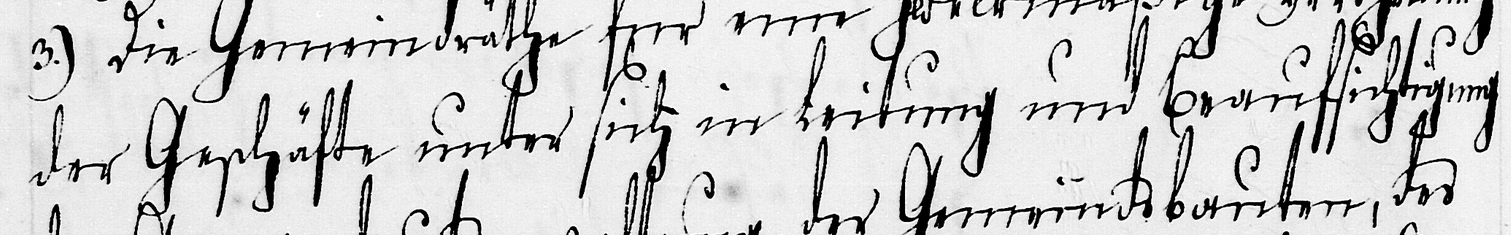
der Geschäfte unter sich in Leitung und Beaufsichtigung
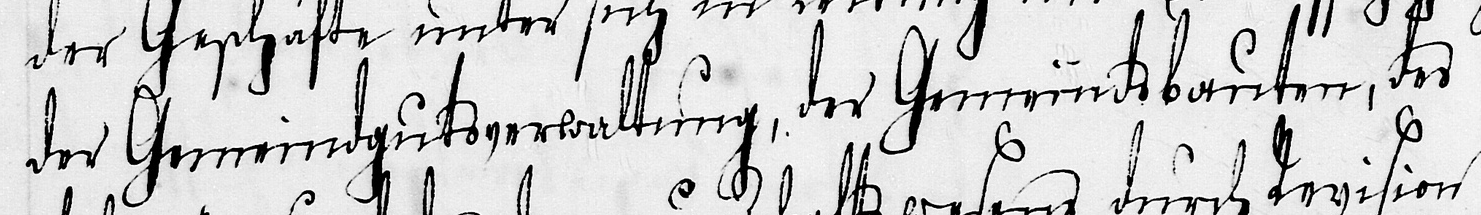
der Gemeindgutsverwaltung, der Gemeindsbauten, des
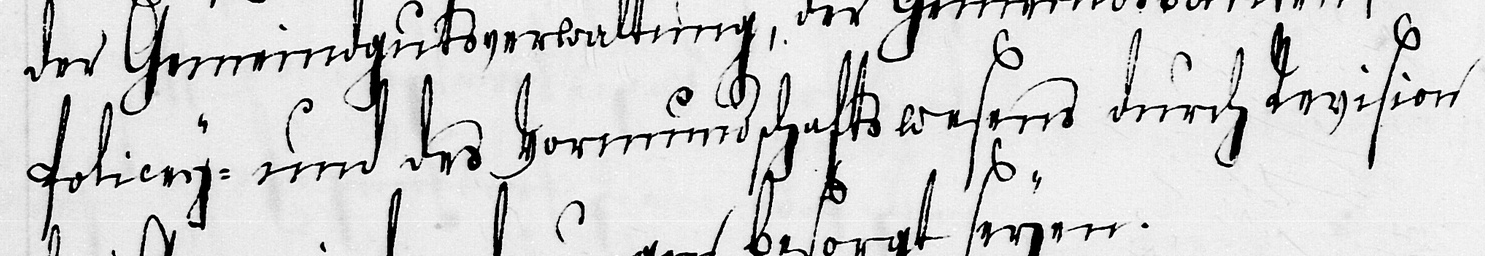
Policey- und des Vormundschaftswesens durch Revision
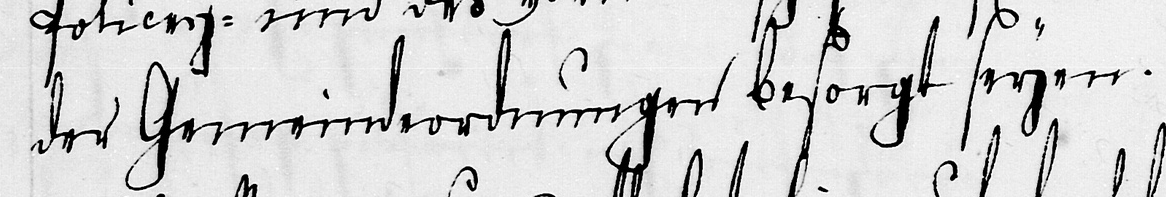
der Gemeindeverordnungen besorgt seyen.
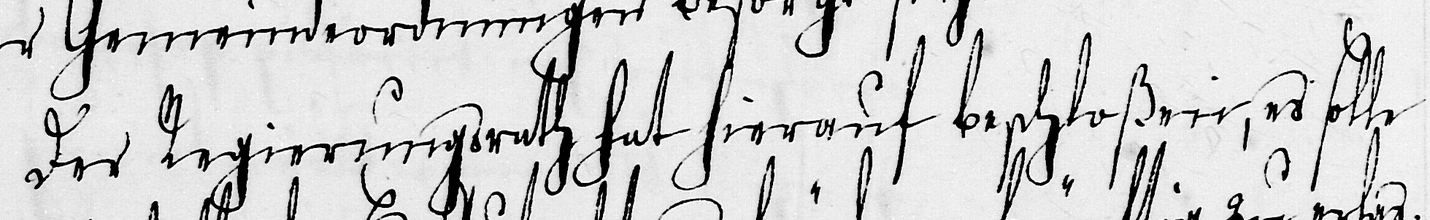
Der Regierungsrath hat hierauf beschloßen, es so¬
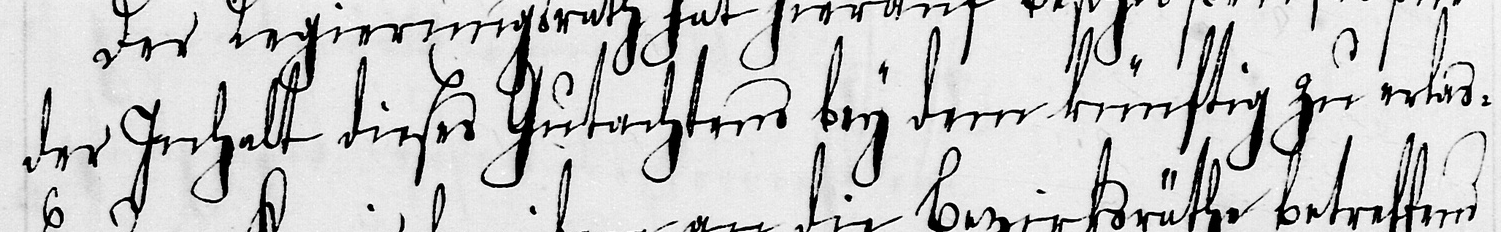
der Inhalt dieses Gutachtens bey dem künftig zu erla¬
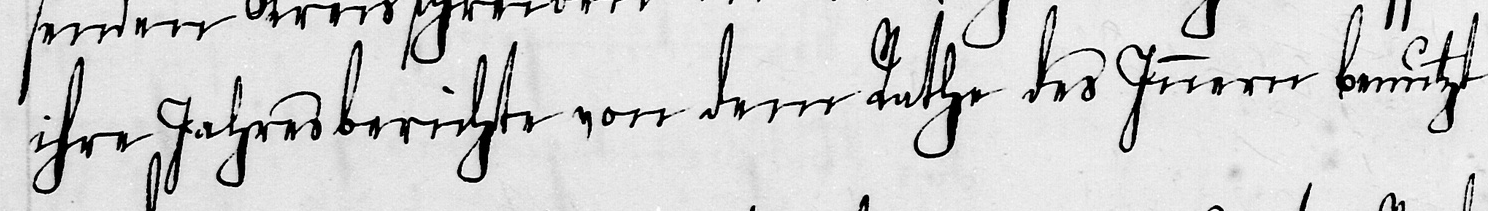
ihre Jahresberichte von dem Rathe des Innern benutzt
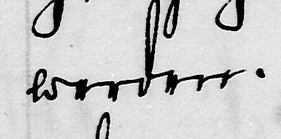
werden.
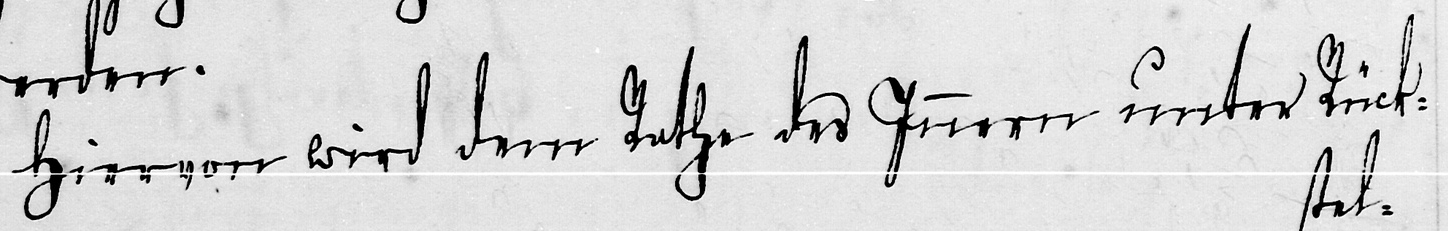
Hiervon wird dem Rahte des Innern unter Rück-
